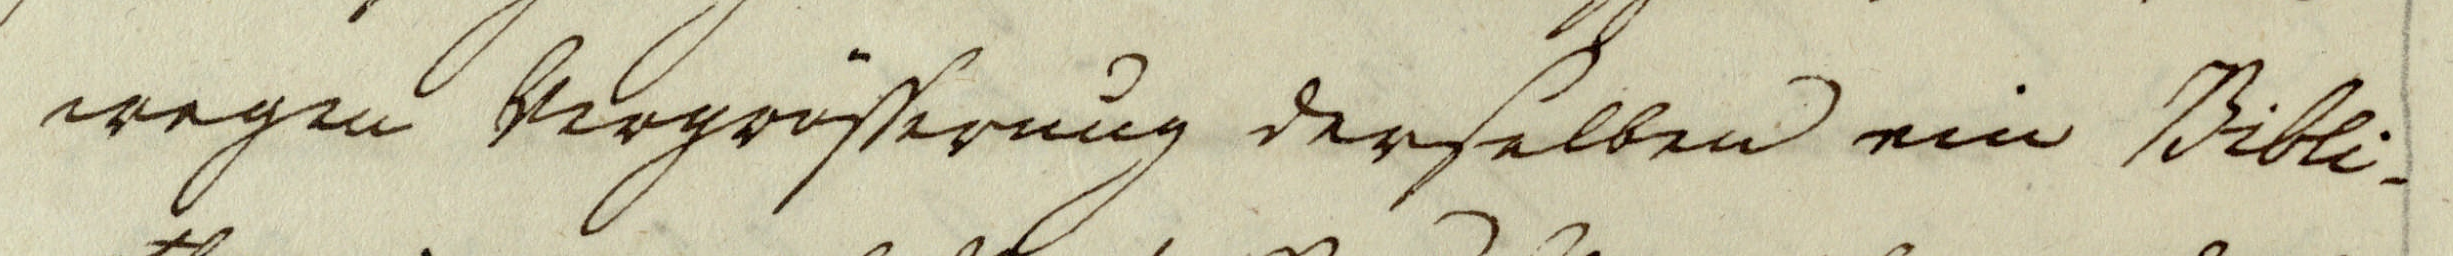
wegen Vergrößerung derselben ein Bibli¬
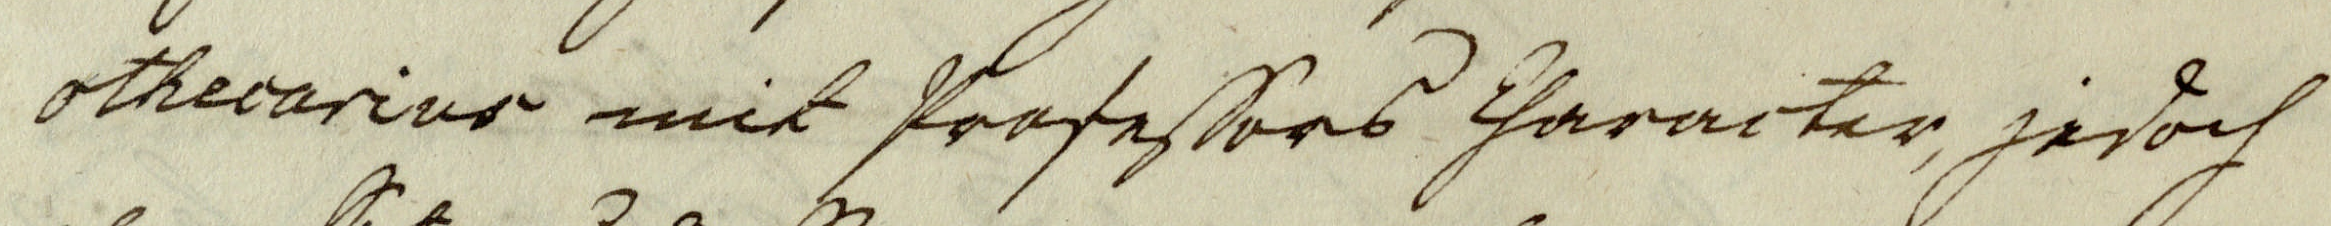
othecarius mit Professors Character, jedoch
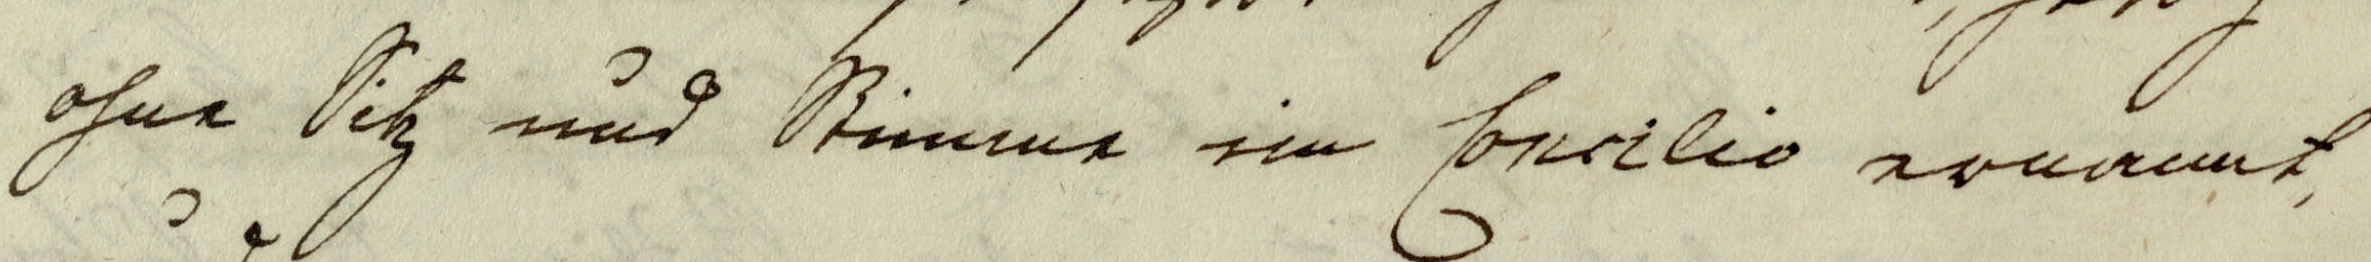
ohne Sitz und Stimme im Concilio ernannt,
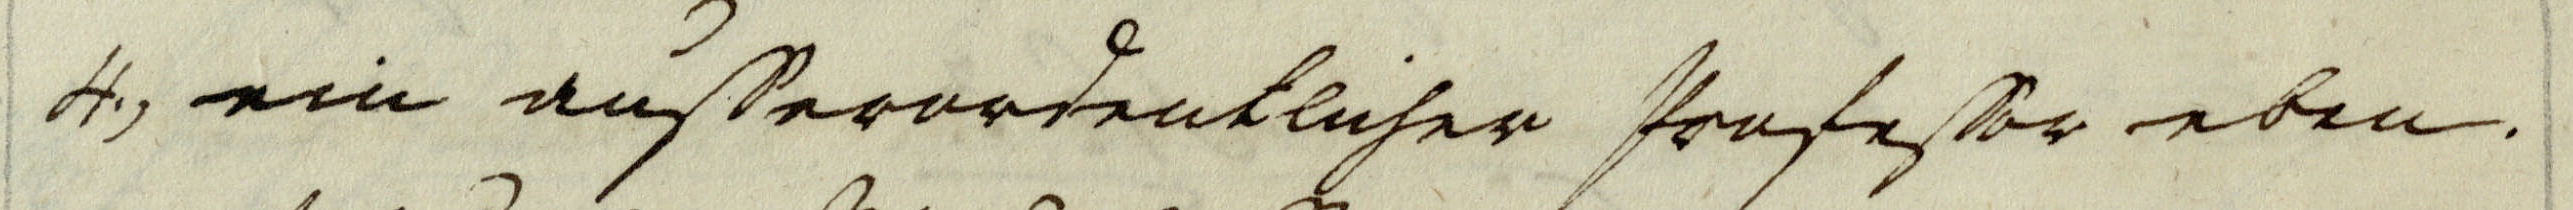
4., ein außerordentlicher Professor eben¬
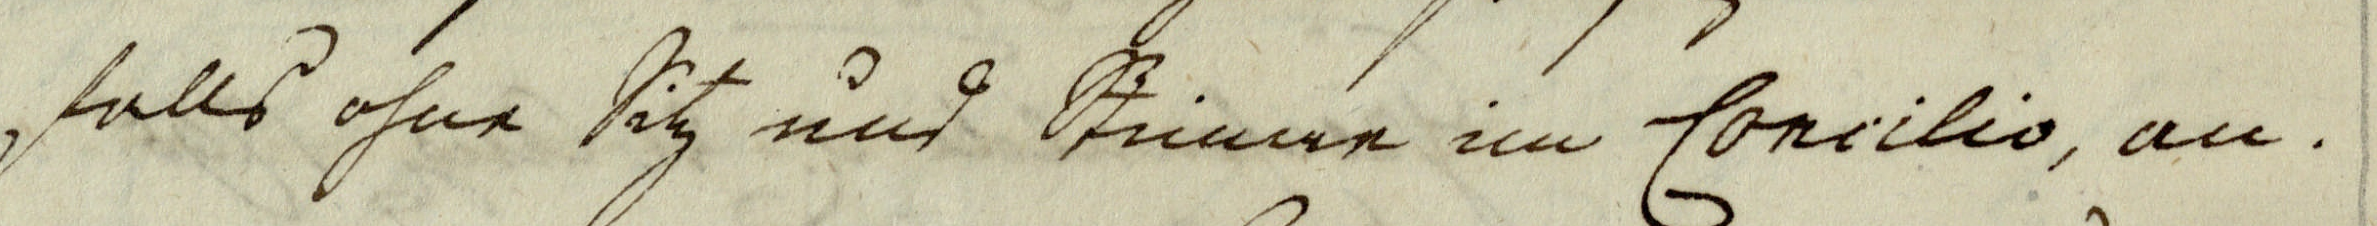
falls ohne Sitz und Stimme im Concilio, an¬
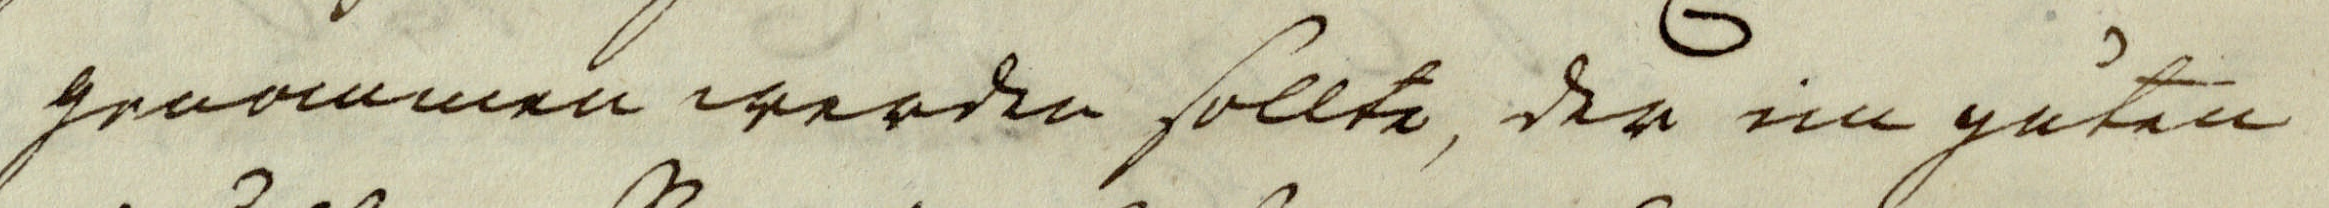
genommen werden sollte, der im guten
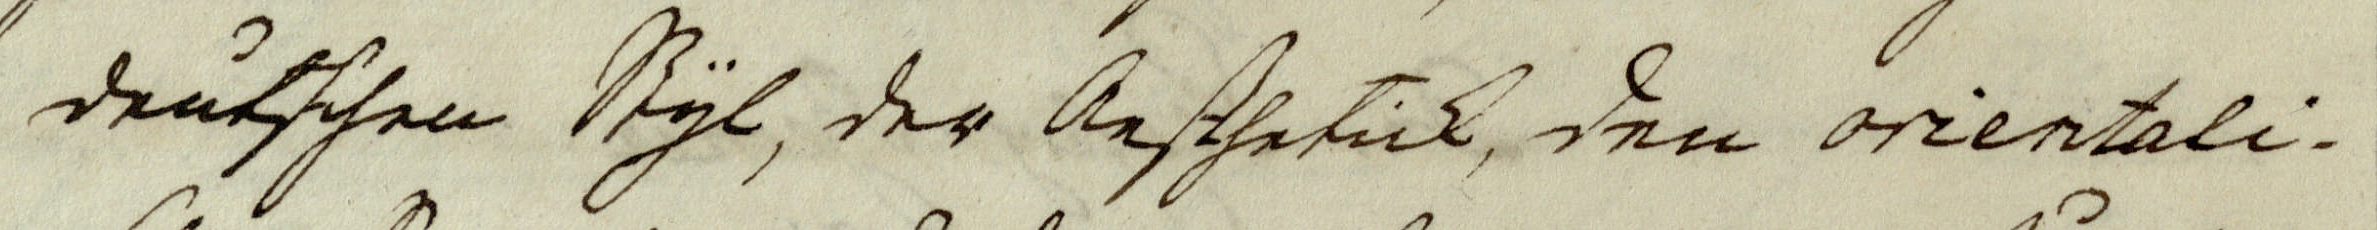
deutschen Stÿl, der Aesthetick, den orientali¬
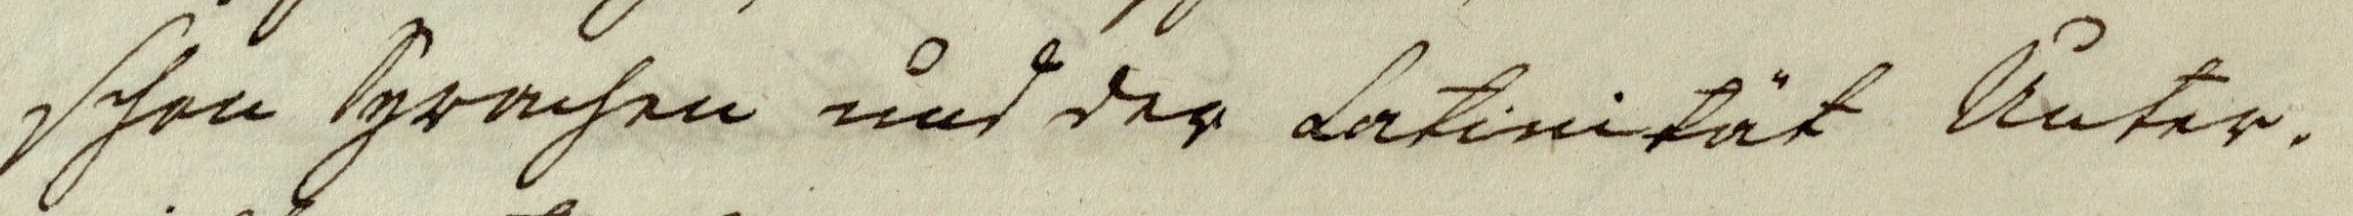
schen Sprachen und der Latinität Unter¬
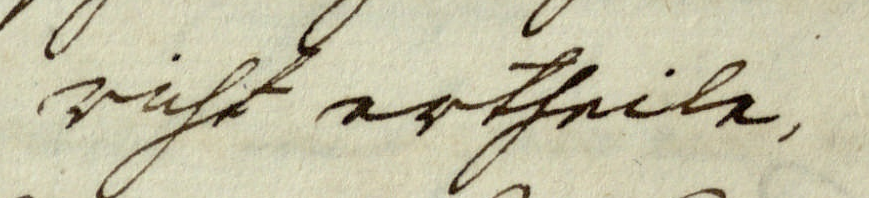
richt ertheile,
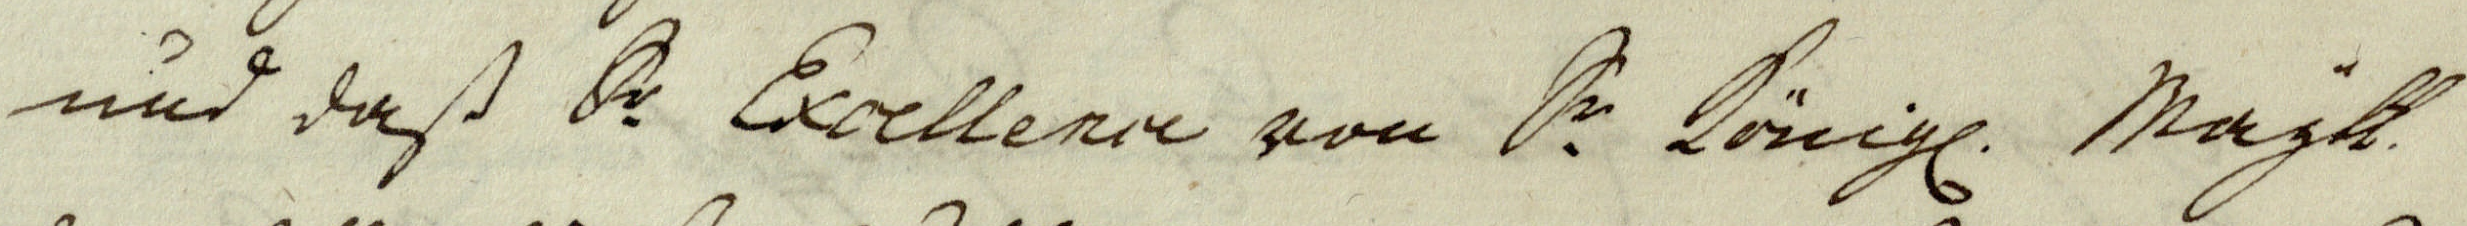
und daß Sr. Excellence von Sr. Königl. Maÿst.
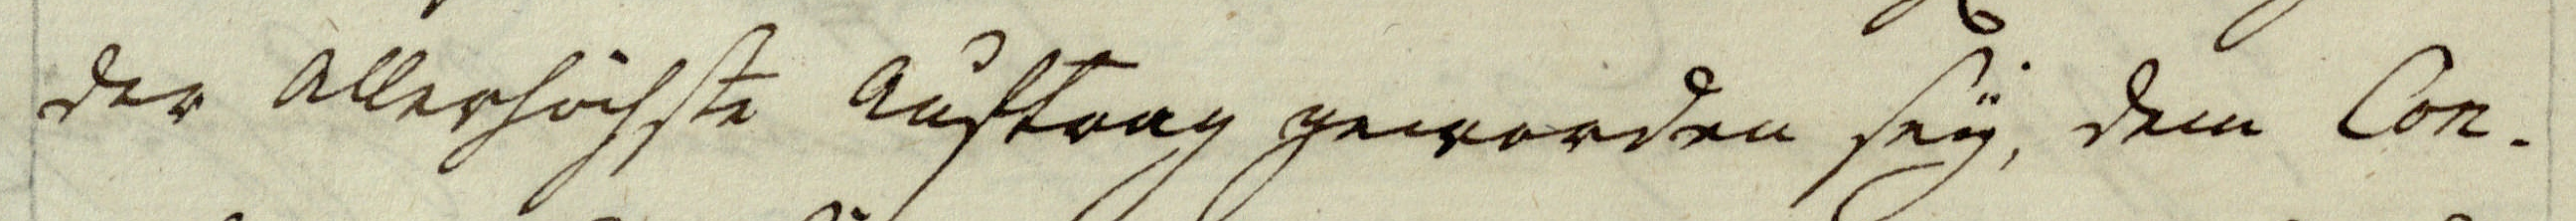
der Allerhöchste Auftrag geworden seÿ, dem Con¬
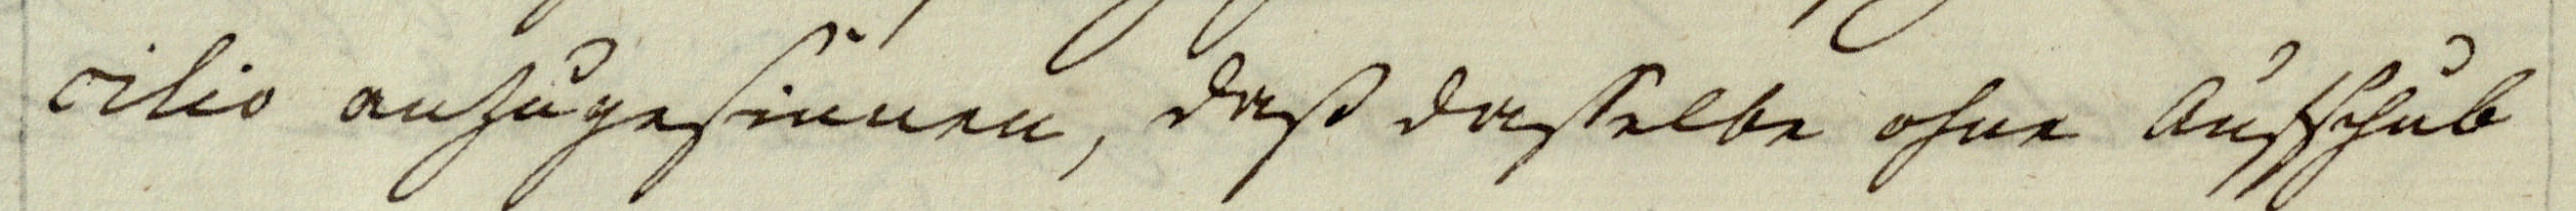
cilio anzugesinnen, daß dasselbe ohne Aufschub
